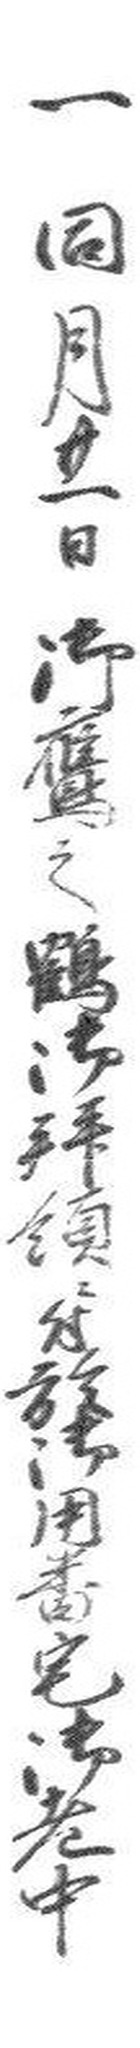一同月廿一日御鷹之鶴御拝領ニ付於御用番宅御老中
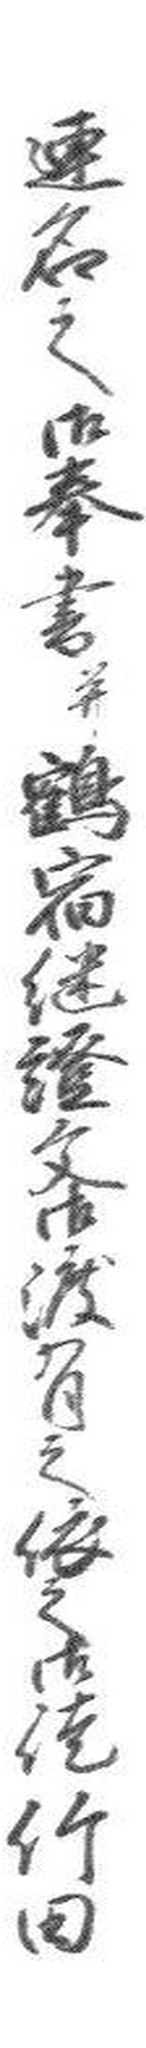連名之御奉書幷鶴宿継証文御渡有之依之御徒竹田
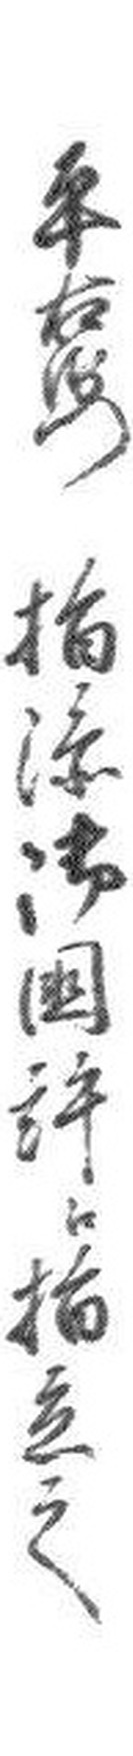平右衛門指添御国許江指立之
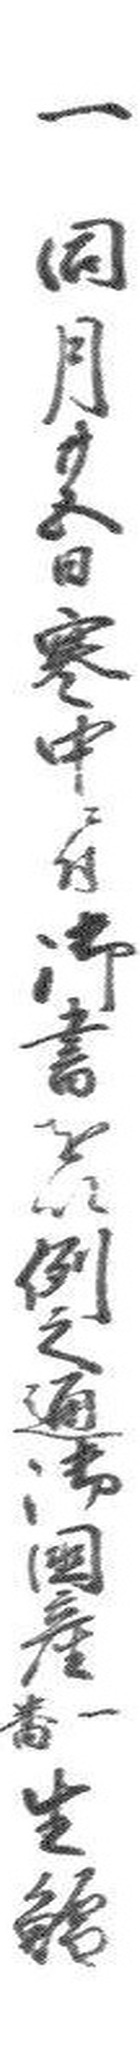一同月廿五日寒中ニ付御書を以例之通御国産一番生鱈
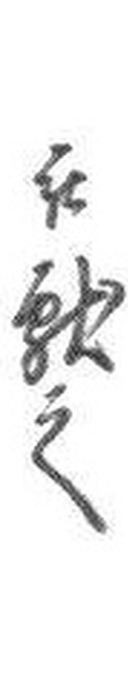被献之
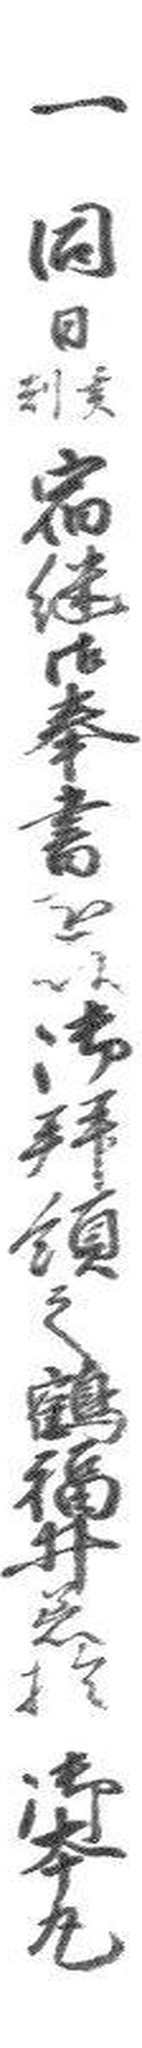一同日亥刻宿継御奉書を以御拝領之鶴福井着於御本丸
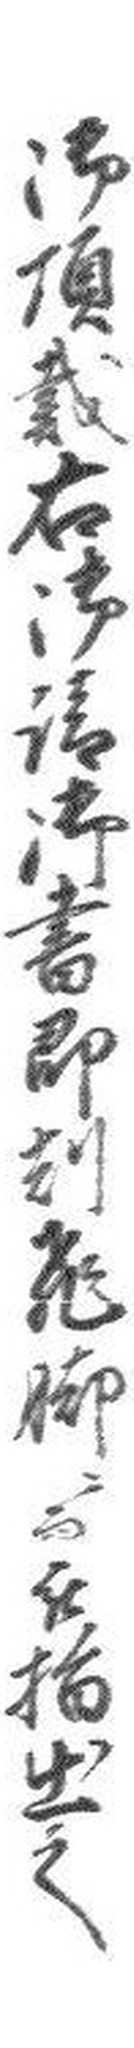御頂戴右御請御書即刻飛脚ニ而被指出之
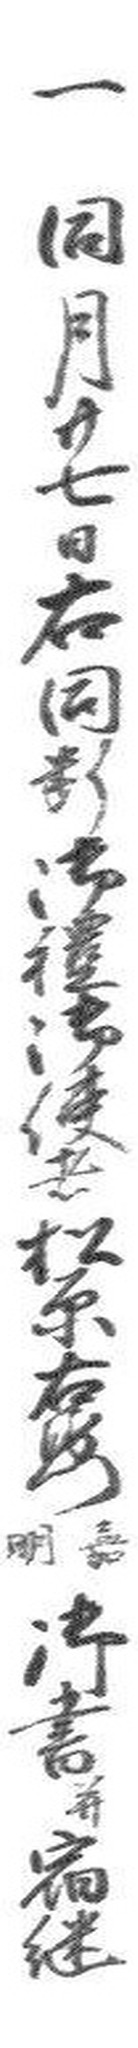一同月廿七日右同断御礼御使者松原右衛門嘉明御書幷宿継

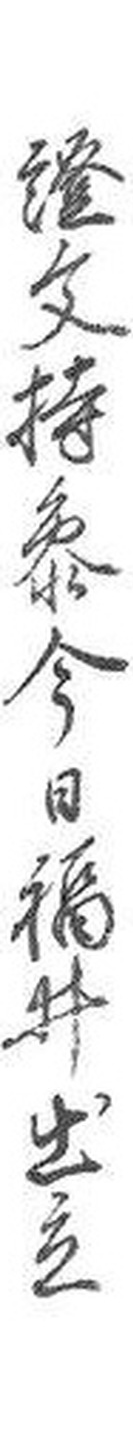証文持参今日福井出立
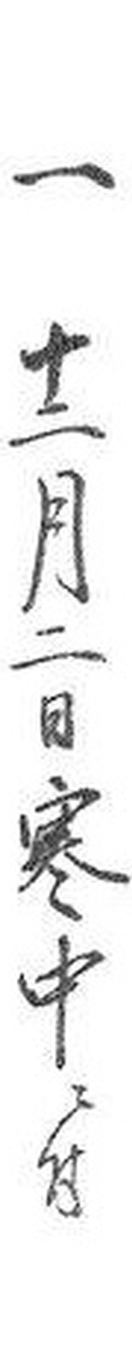一十二月二日寒中ニ付
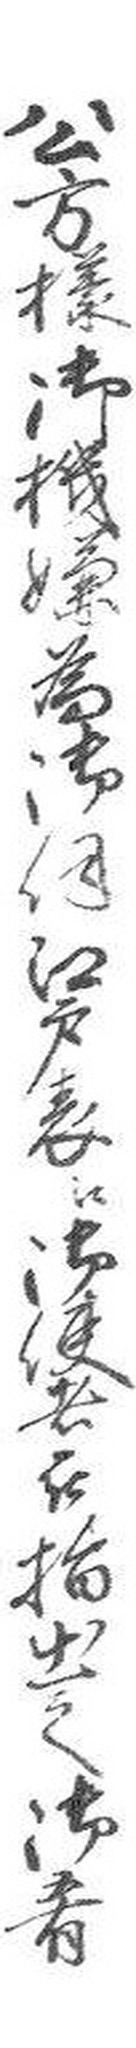公方様御機嫌為御伺江戸表江御使者被指出之御肴
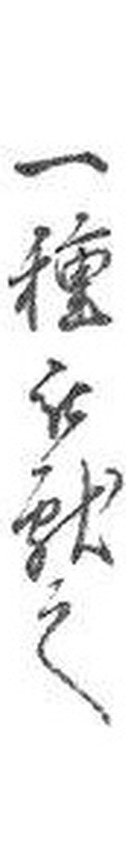一種被献之
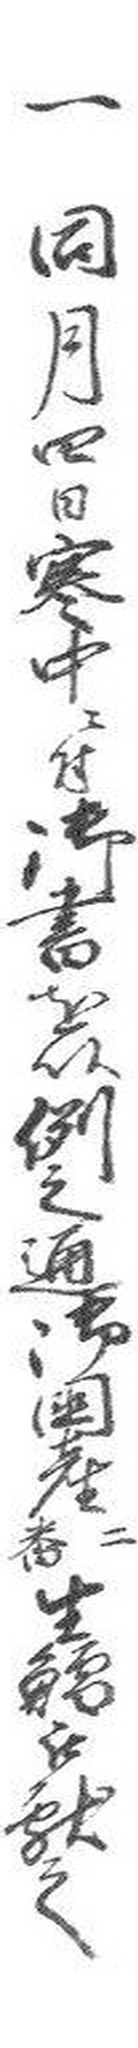一同月四日寒中ニ付御書を以例之通御国産二番生鱈被献之
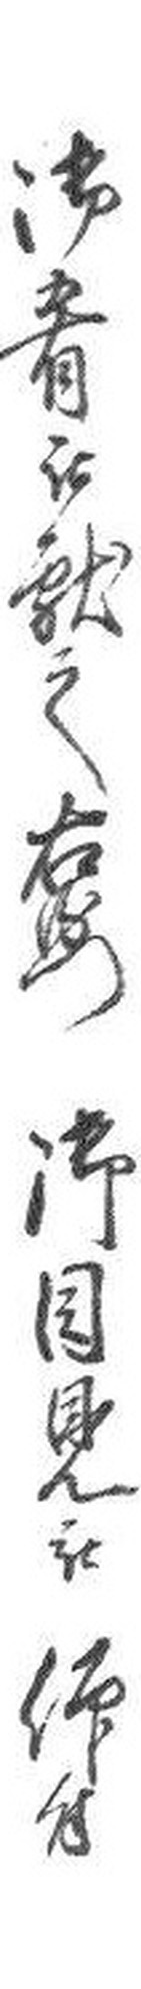御肴被献之右衛門御目見被仰付
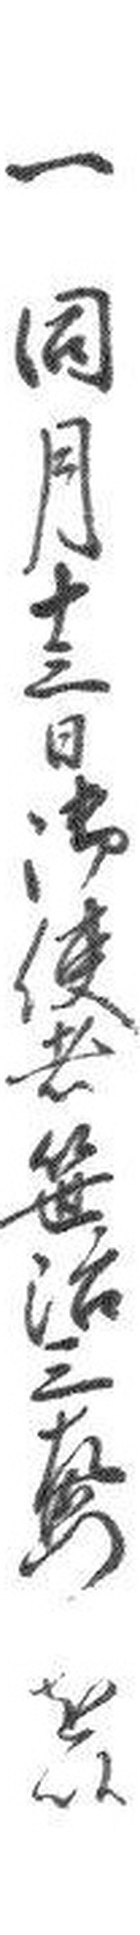一同月十三日御使者笹治三左衛門を以
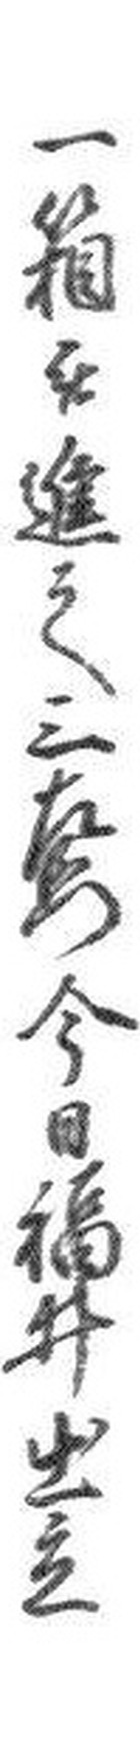一箱被進之三左衛門今日福井出立
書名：家譜 七 光通公 従寛文四年到同九年
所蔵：福井県文書館 Fukui Prefectural Archives
